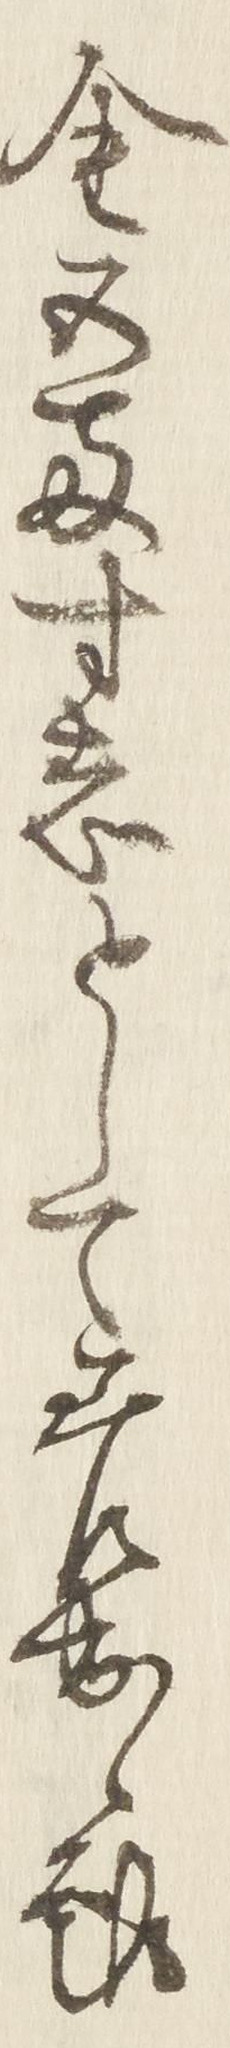金五両寸志として差出候趣
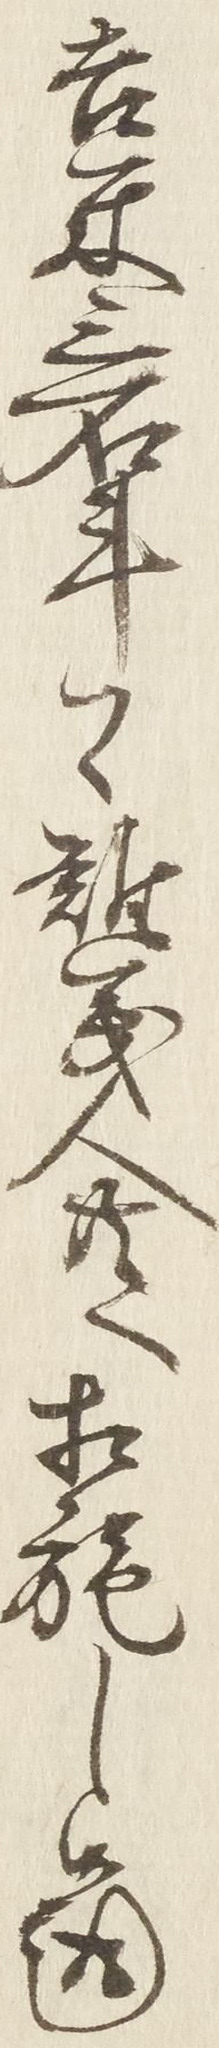吉米三石斗ッゝ難義人共へ相施し候趣
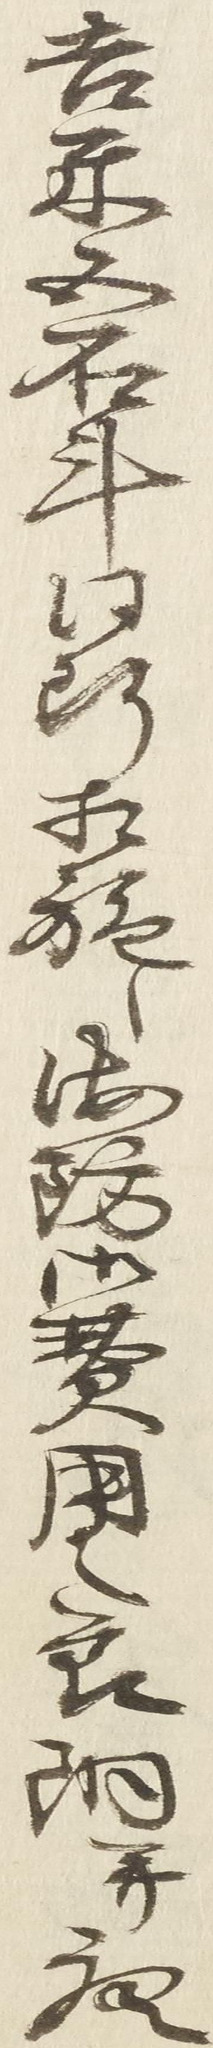吉米五石斗同断相施し海防御費用之節銅并唐
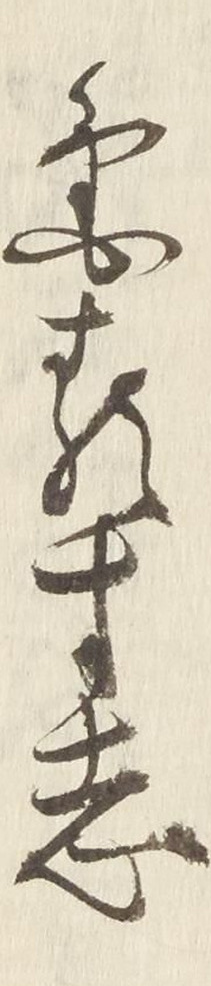金類寸志
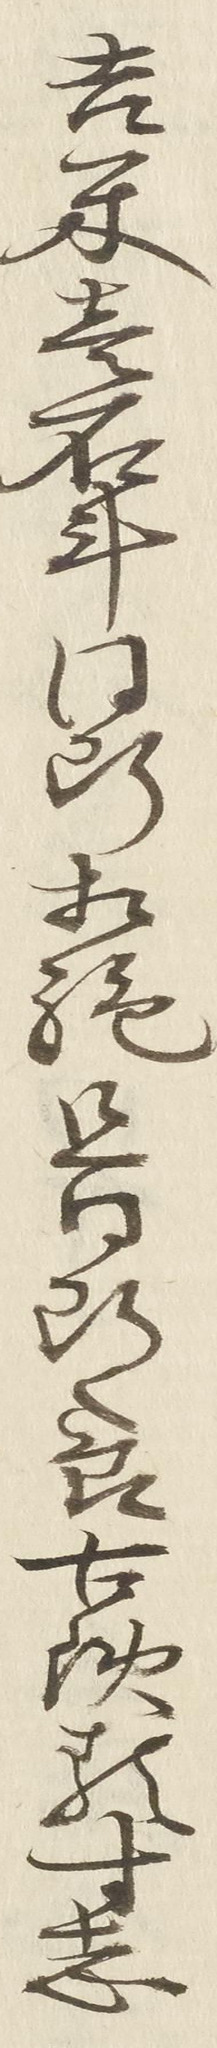吉米壱石斗同断相施且同断之節古鉄類寸志
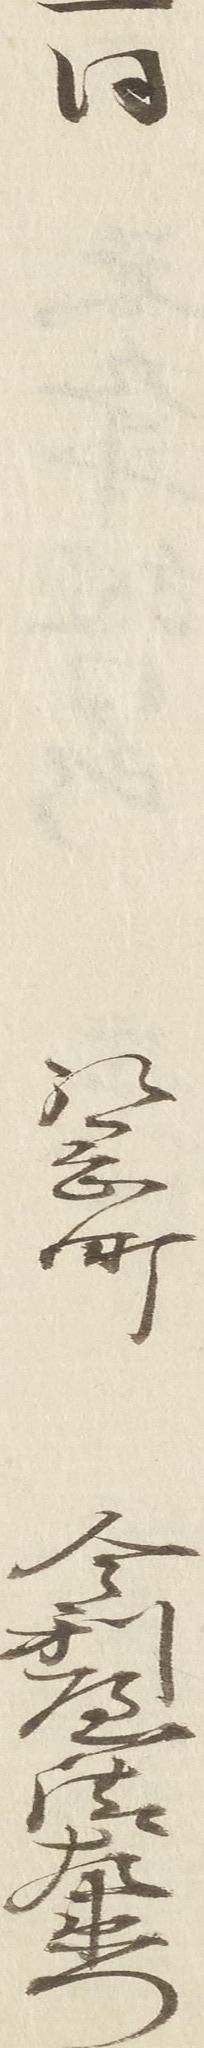一同弘岡町金利屋清左衛門
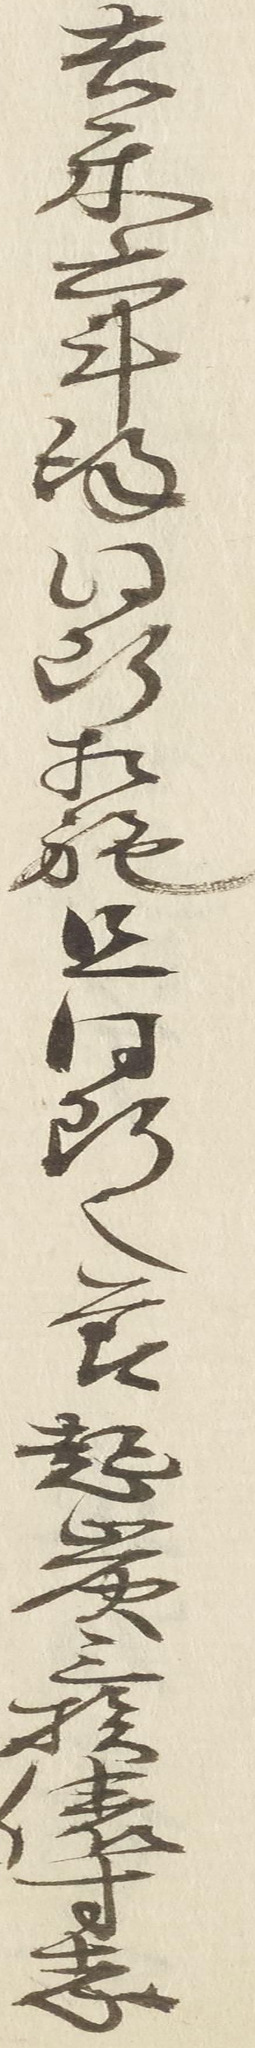吉米六斗餘同断相施且同断之節起炭三拾俵寸志
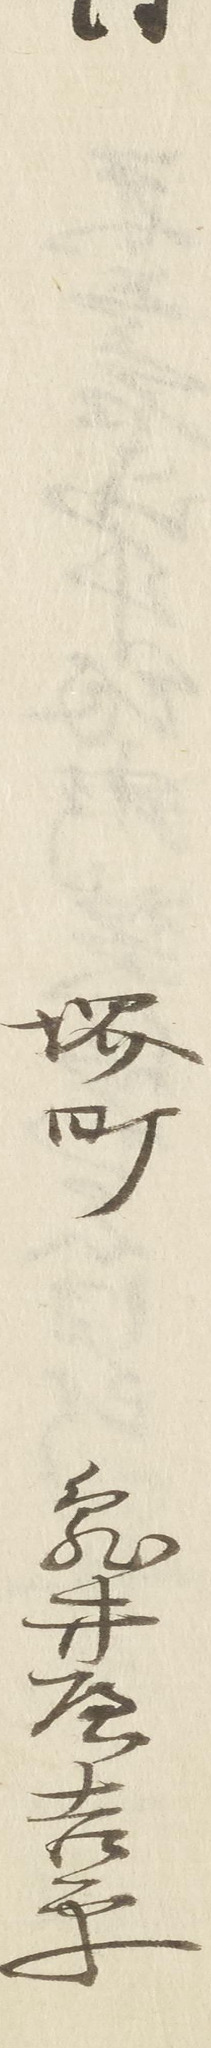一同堺町亀井屋吉平
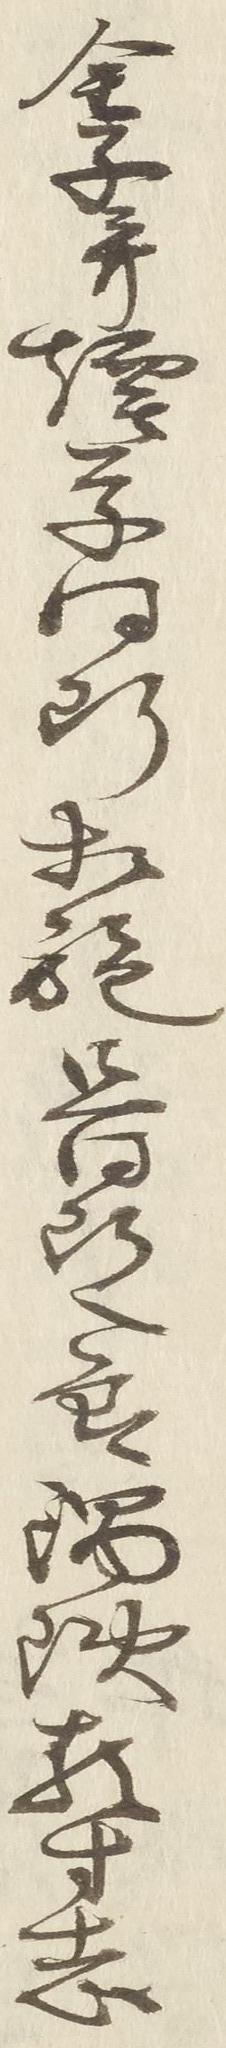金子并煙草同断相施且同断之節鍋鉄類寸志
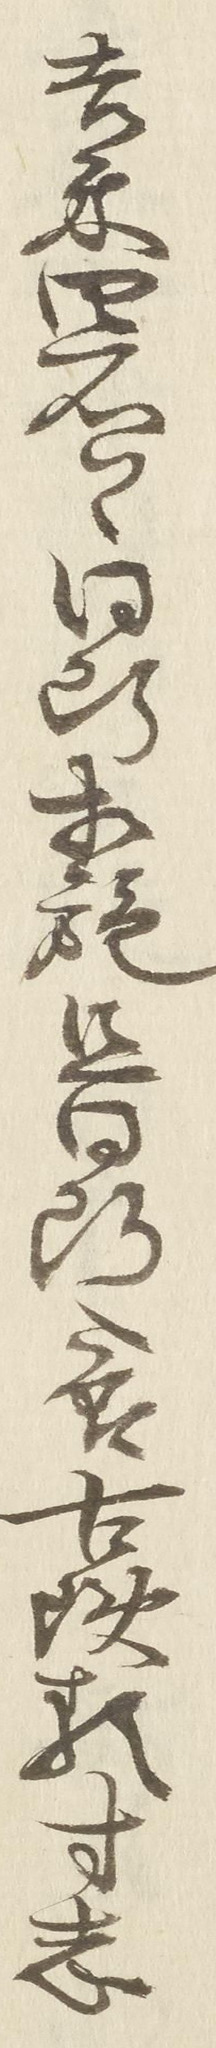吉米四石ツゝ同断相施且同断之節古鉄類寸志
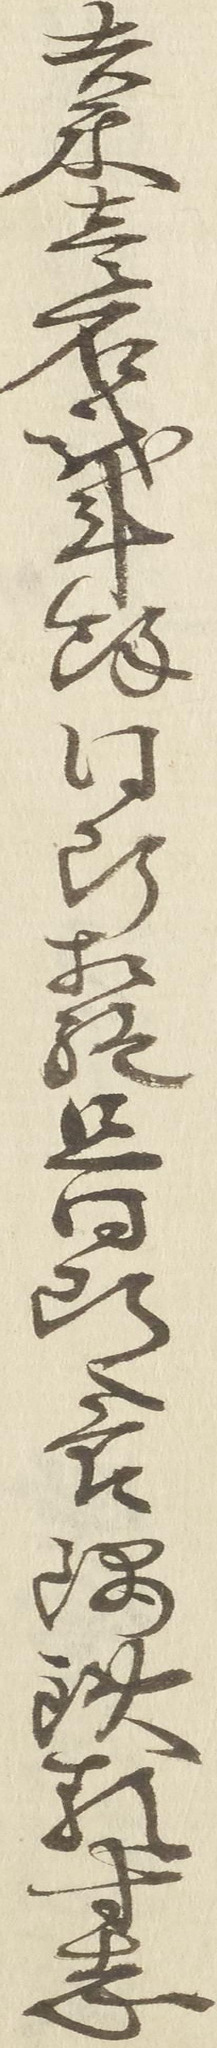吉米壱石弐斗餘同断相施且同断之節鍋鉄類寸志

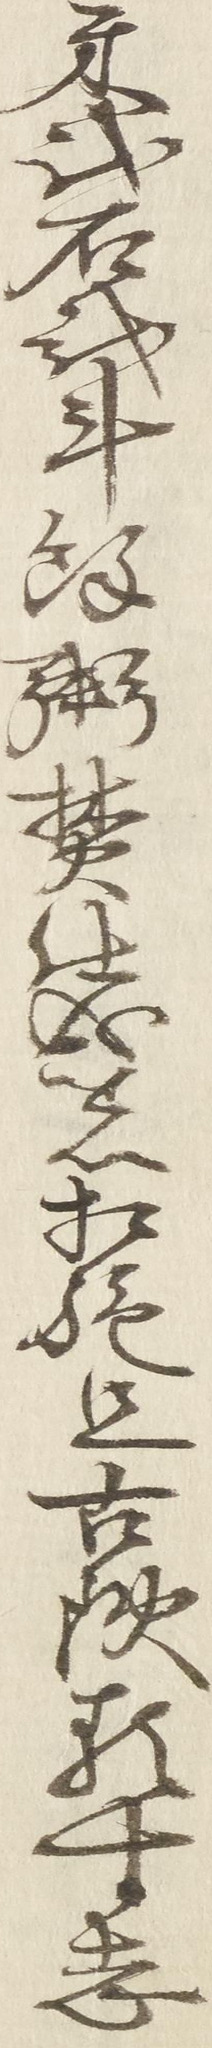米弐石弐斗餘粥焚仕成を以相施且古鉄類寸志
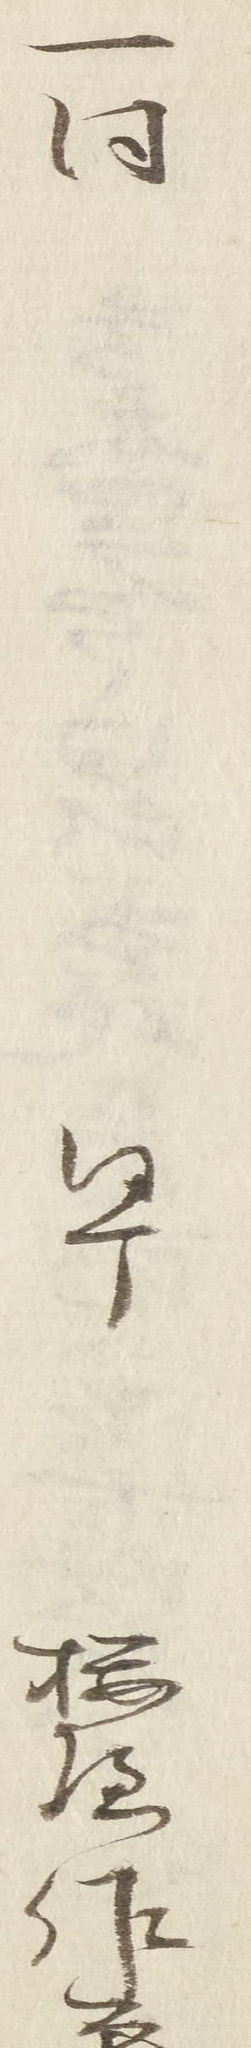一同同丁櫻屋作平
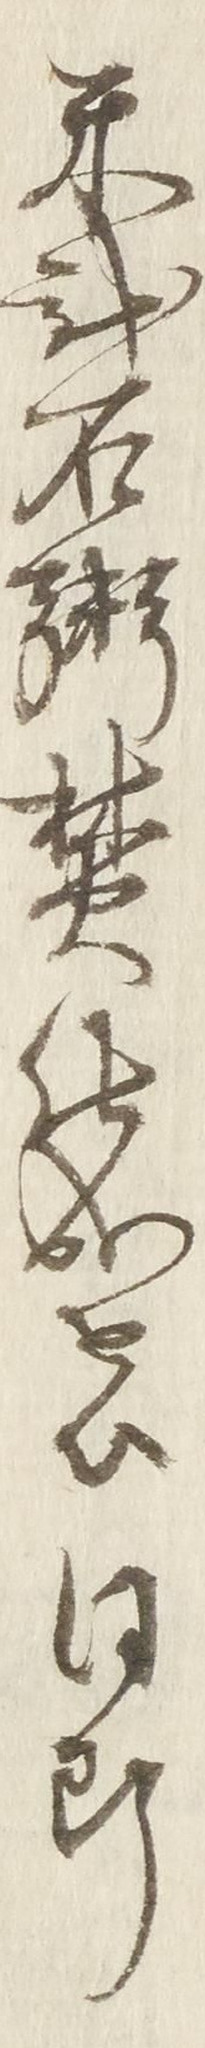米弐石粥焚仕成を以同断
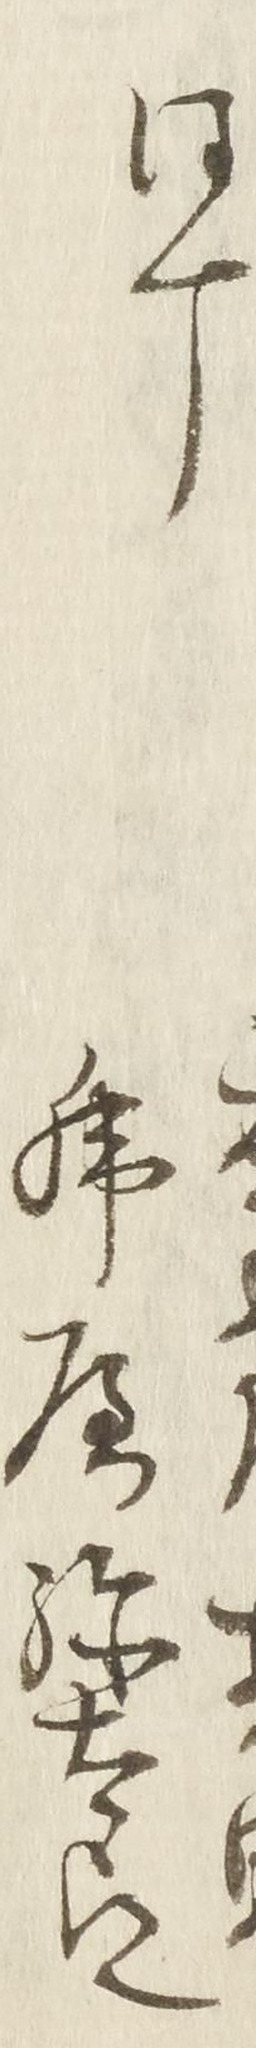乕屋弥太郎
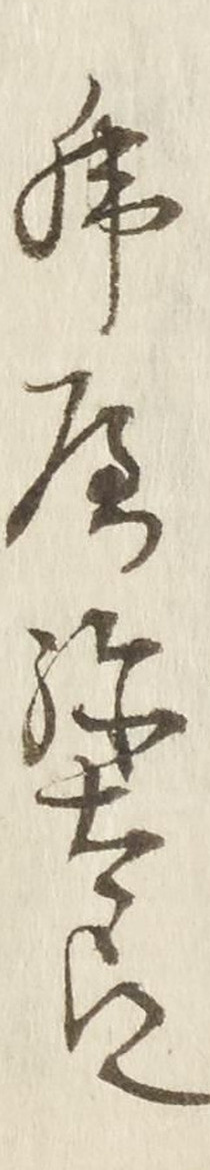乕屋弥太郎
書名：地震記　下
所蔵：東京大学地震研究所図書室 Earthquake Research Institute Library, The University of Tokyo, JAPAN
